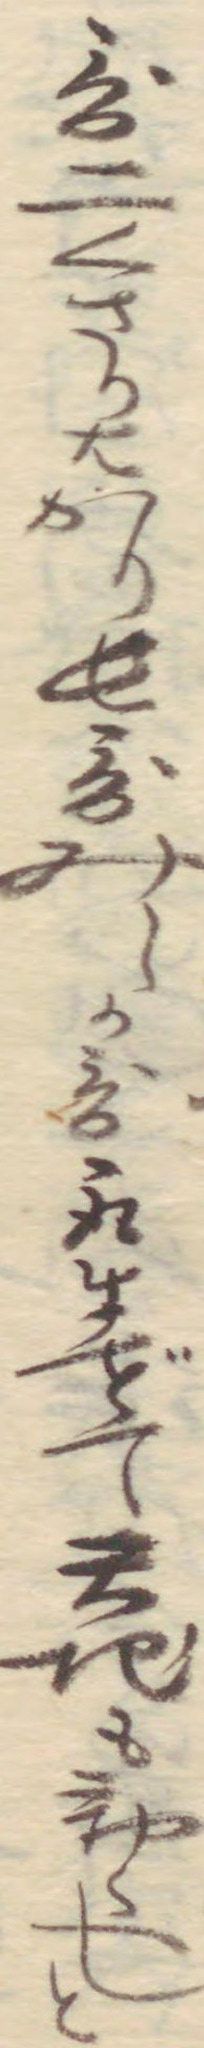歌二くさりはかり長歌みしか歌取まぜて夫地も動くへしと
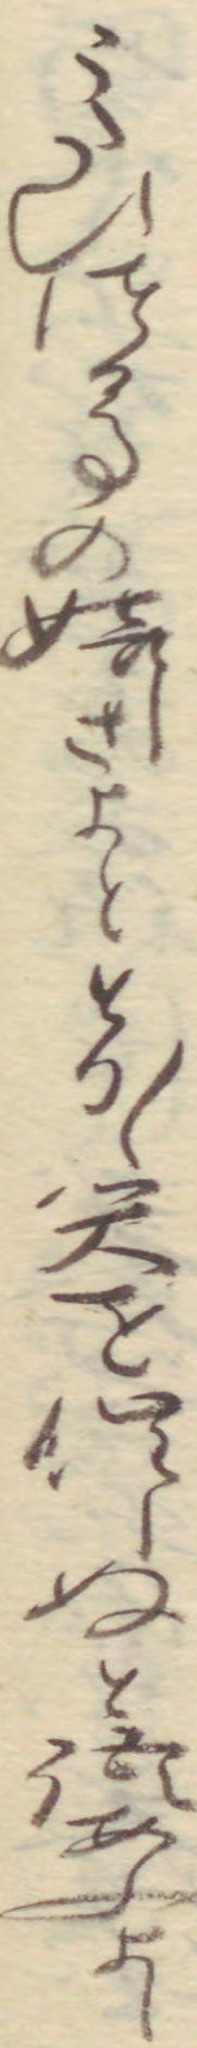うたひつる事の嬉しさよととり〳〵笑を催しぬと語あふよし
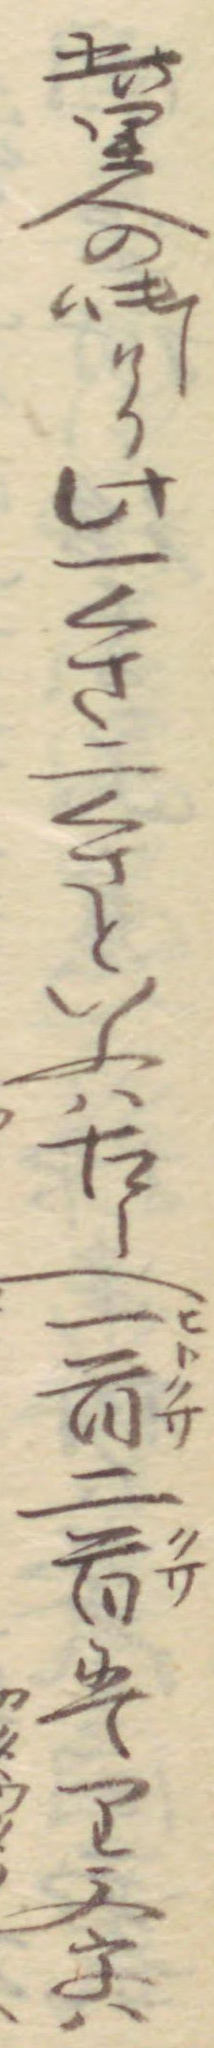此里人の咄しけり此一くさ二くさといふは古しへ一首二首にて里文字は
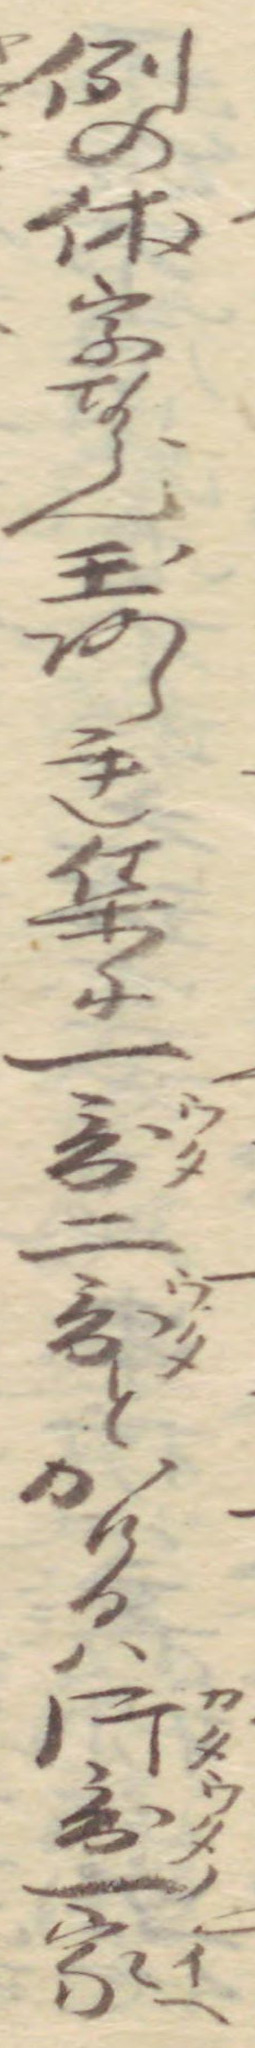例の休字ならん玉あられ集に一歌二歌とかけるは片歌一家
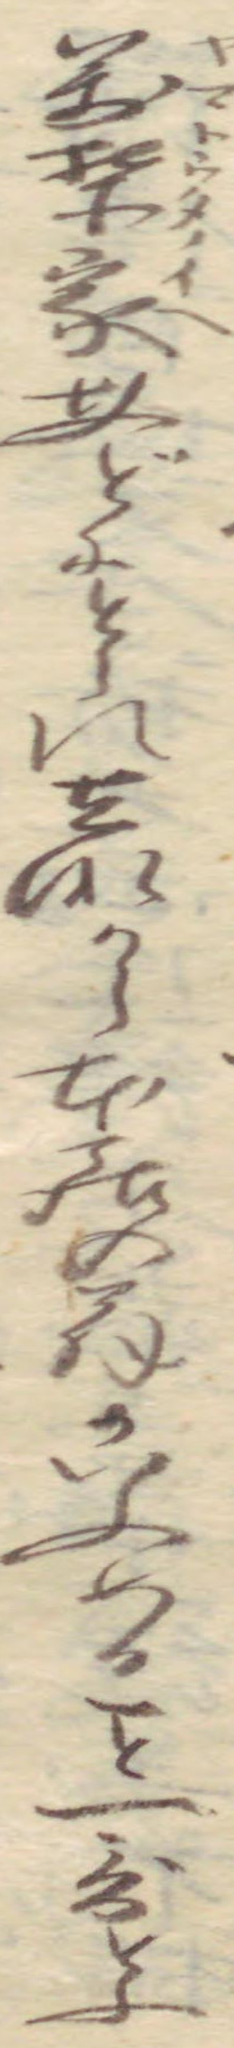万葉家などにとらす去なから本居の翁かいふめること一歌とふ
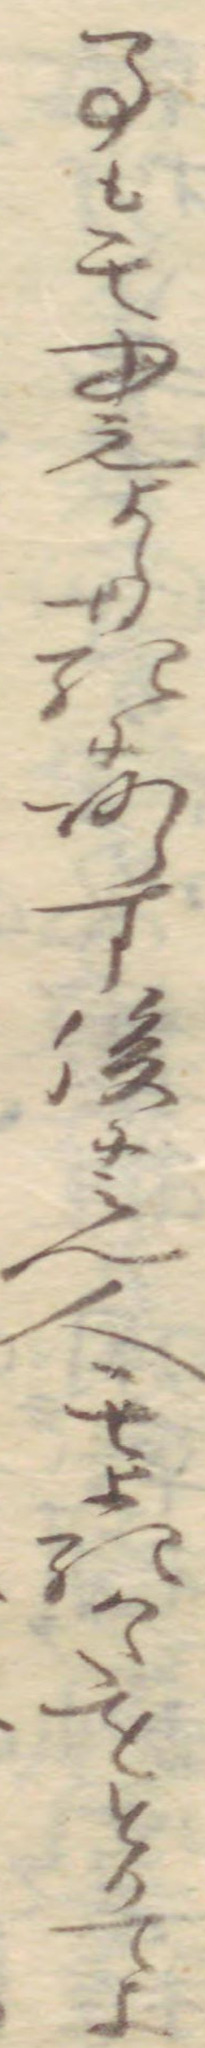事も其ゆえよしなきにあらす後にみん人其よきかたをとりてよ
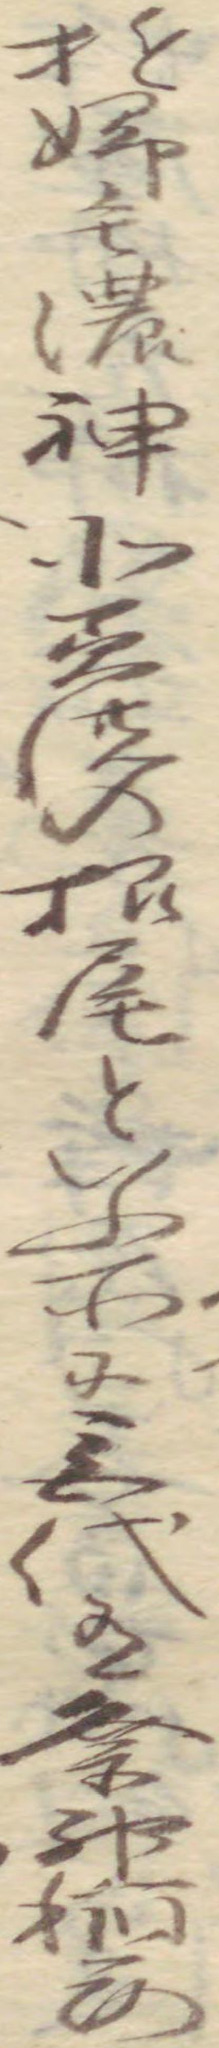遊婦毛濃神北美濃の根尾といふ所に宮代有祭神稲荷
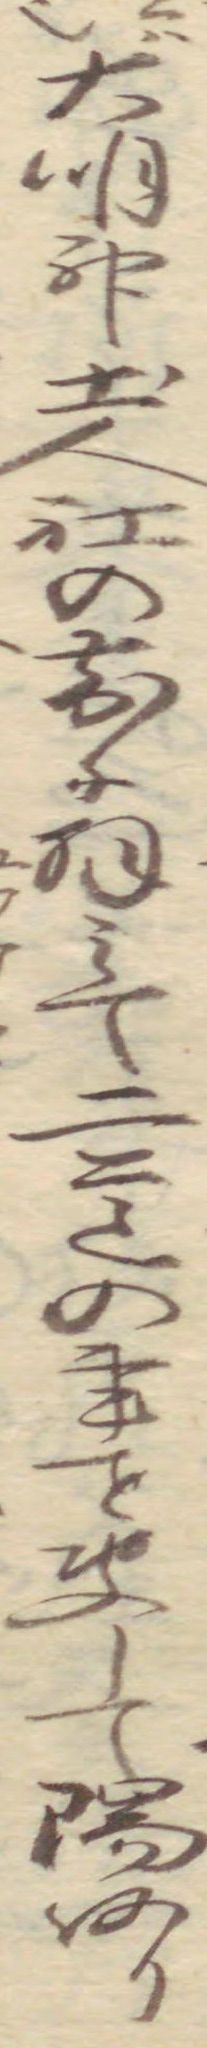大明神土人社の前に拝みて二道の事を決して瑞あり
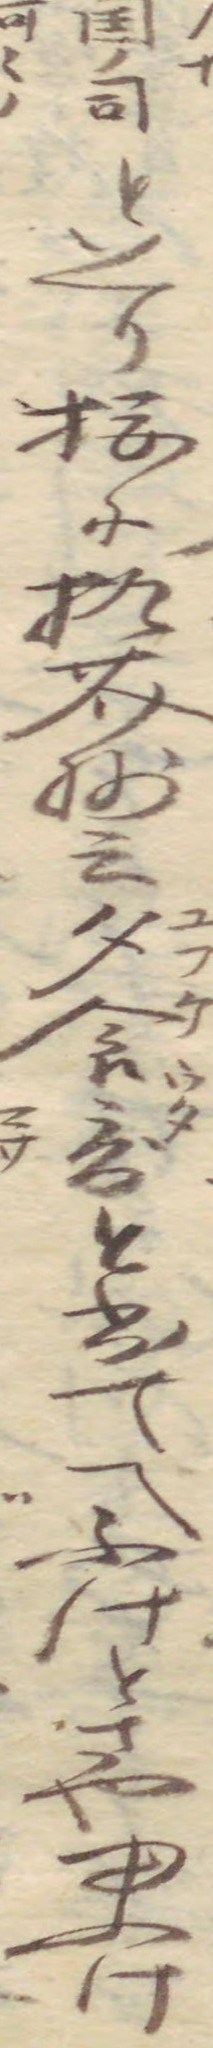といへり按に拾芥抄云夕食歌と書て〽ふけとさやゆふけ
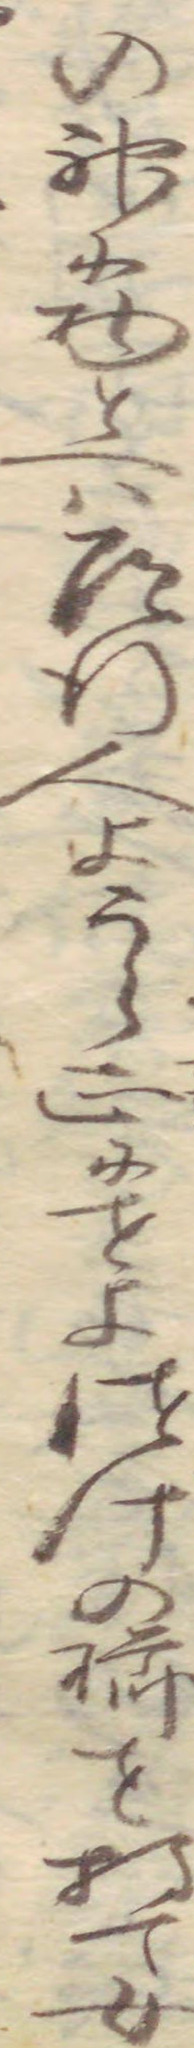の神に物とへは道行人ようら正にせよつげの櫛を持て女
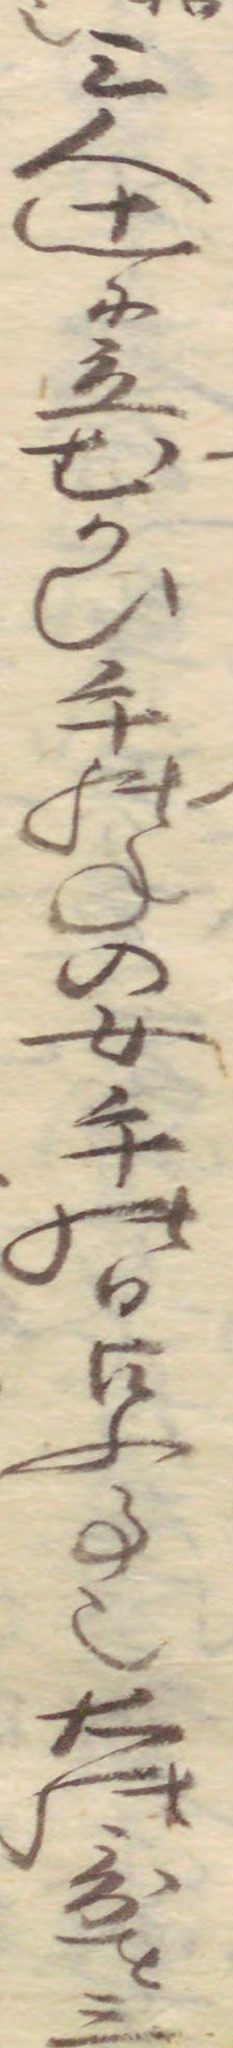三人辻に立むかひ午の年の女午の日占ふ事也右の歌を三
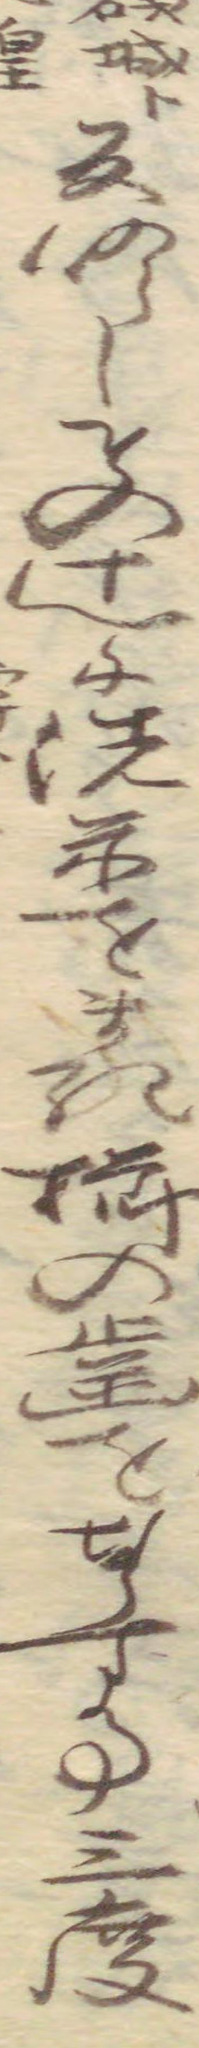反吟しその辻に洗米をまき櫛の歯をならす事三度
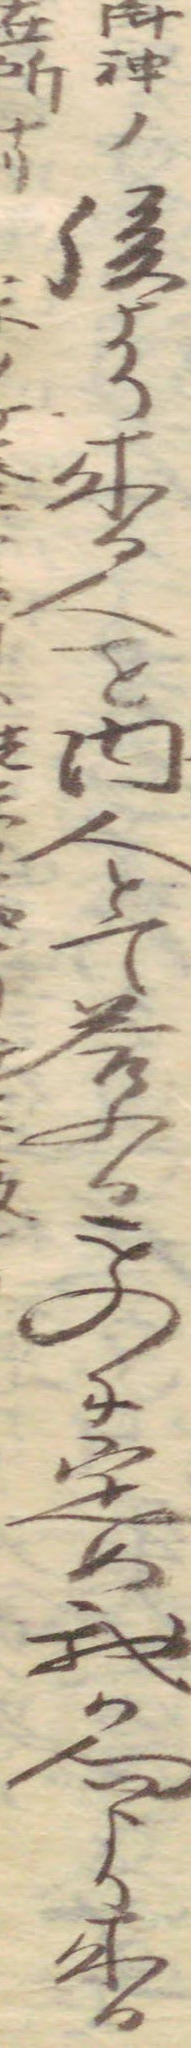後より来る人を内人とて答ふるものに定ぬ我か向より来る

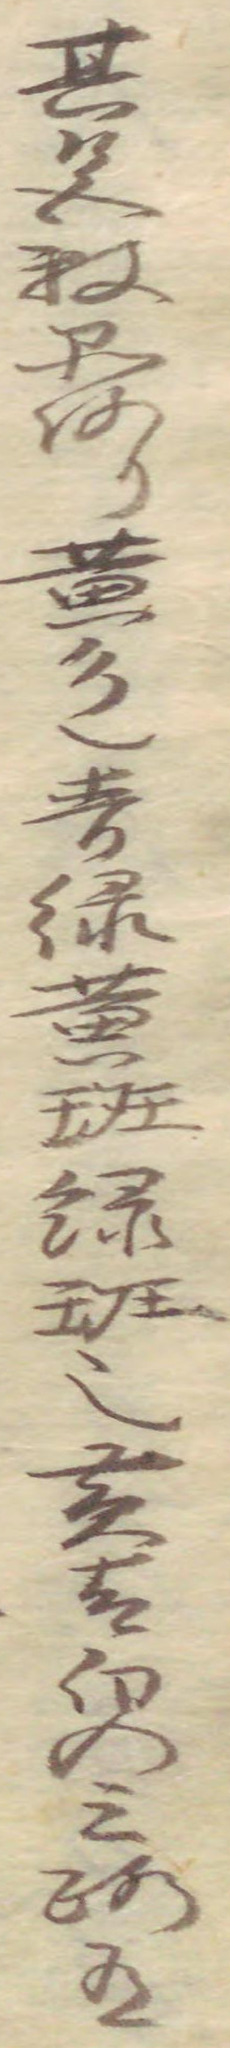其色数品あり黄色青緑黄斑緑斑也黄青白の三路有
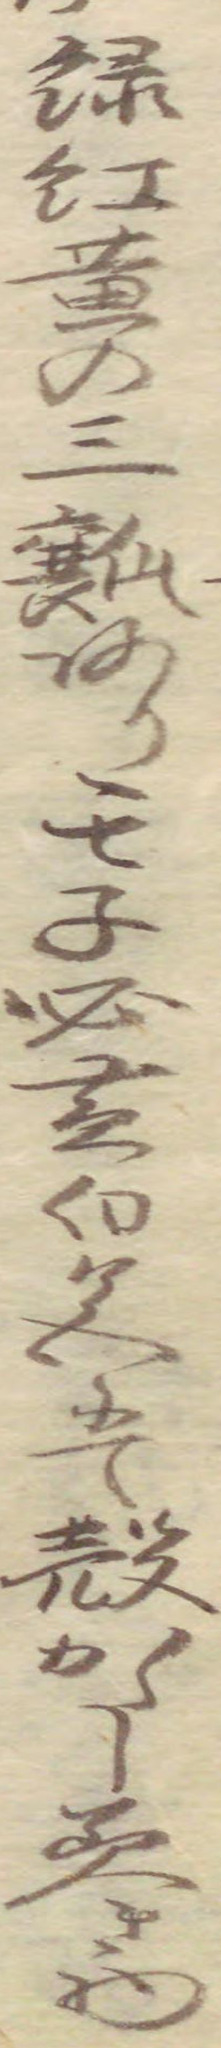緑紅黄の三瓤あり其子必黄白色にて殻かたし美き物
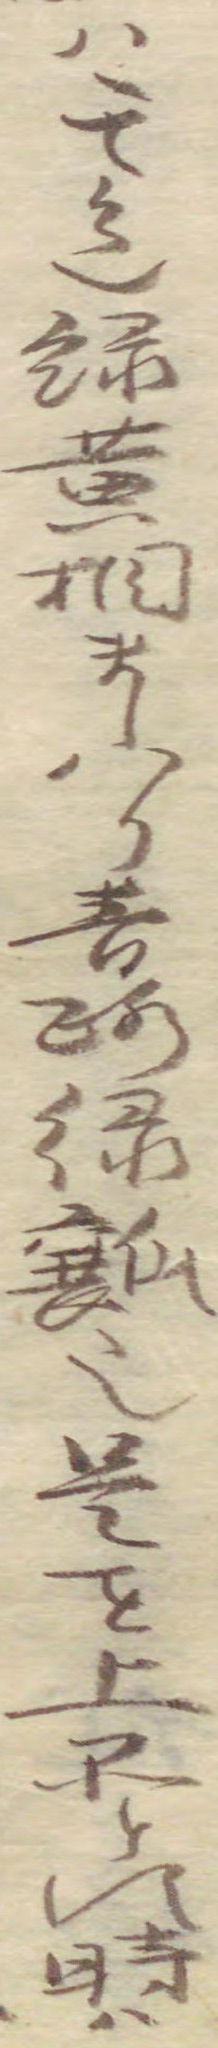は其色緑黄相ましはり青路緑瓤也是を上品とす時は
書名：鶯宿雑記. 巻263-264
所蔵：国立国会図書館 National Diet Library, JAPAN
